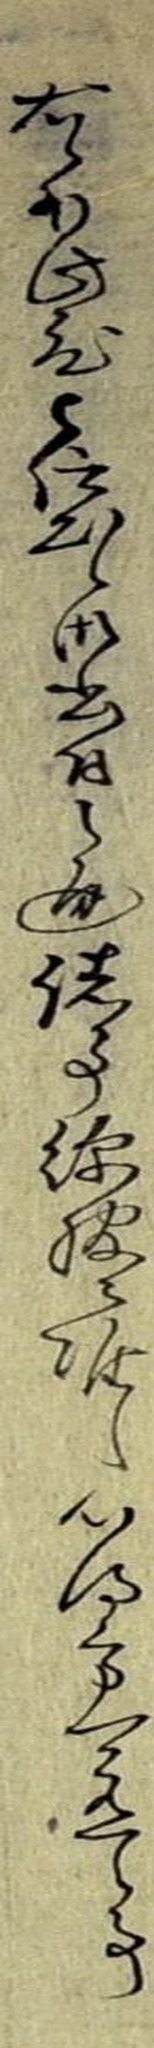右之外此度被仰出候御書付之通諸事綿服ニ准し心得方可有之
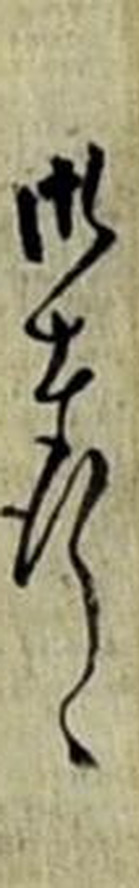御奉行へ
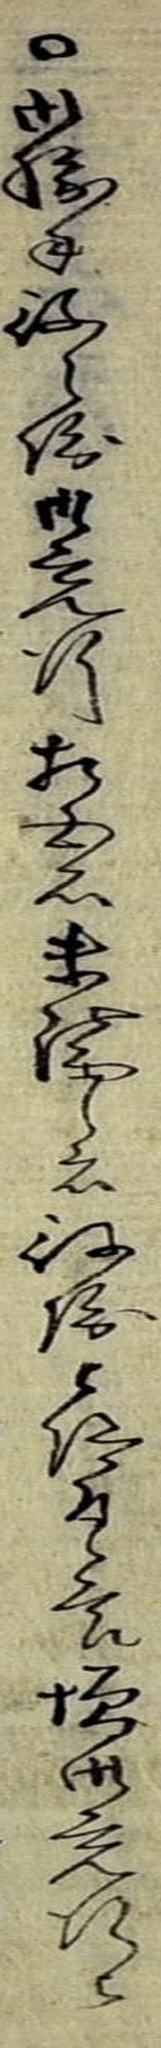○御勝手役之儀御充行拾五石未満之者役儀被仰付候節増御充行被
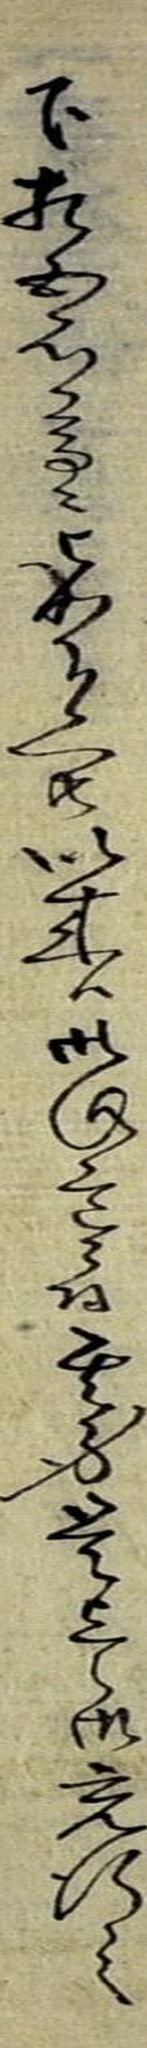下拾五石高ニ被成下候へ共以来ハ御趣意ニ付其身是迄之御宛行之
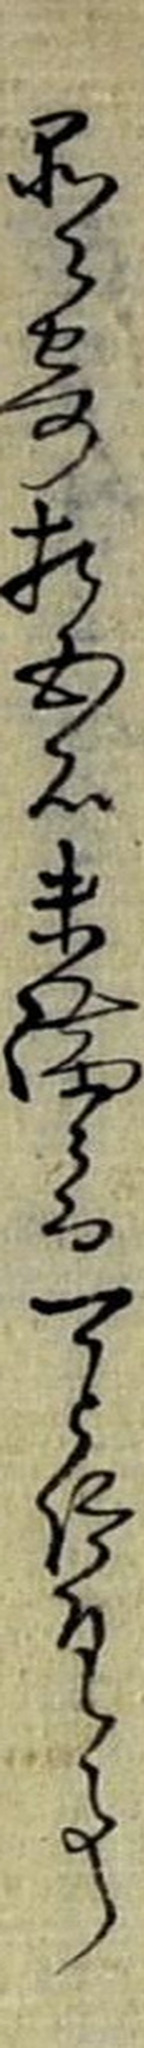品々寄拾五石未満ニ而可被仰付候事
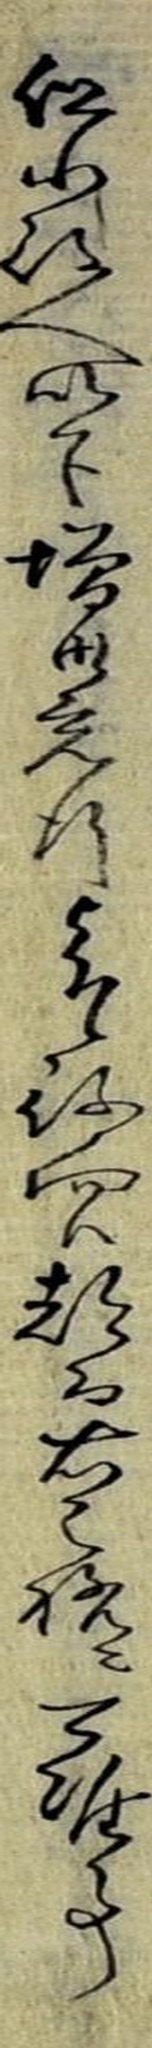但小役人以下増御充行被下役向ハ都而右之格ニ可准事
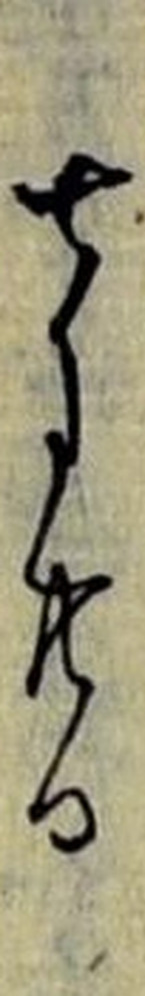七月廿日
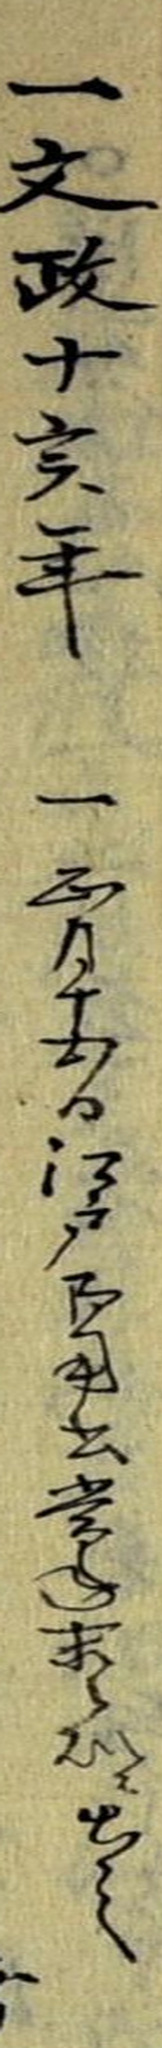一文政十亥年一正月十五日江戸御用当年末之処ニ出之
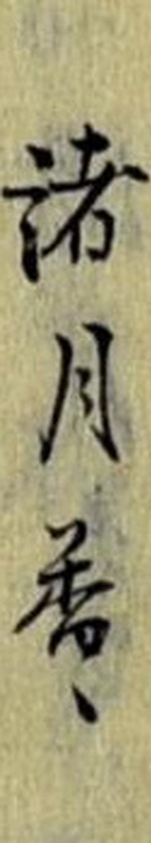諸月番へ
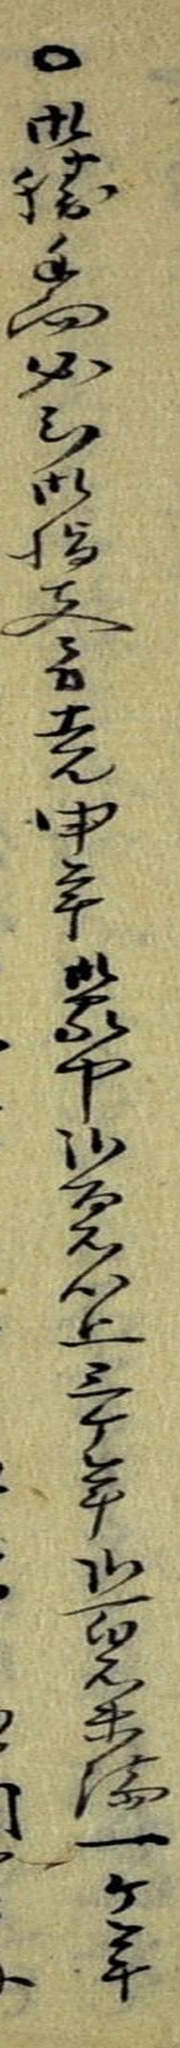○御勝手向必至御指支ニ付去ル申年御家中弐百石以上三ケ年弐百石未満一ケ年
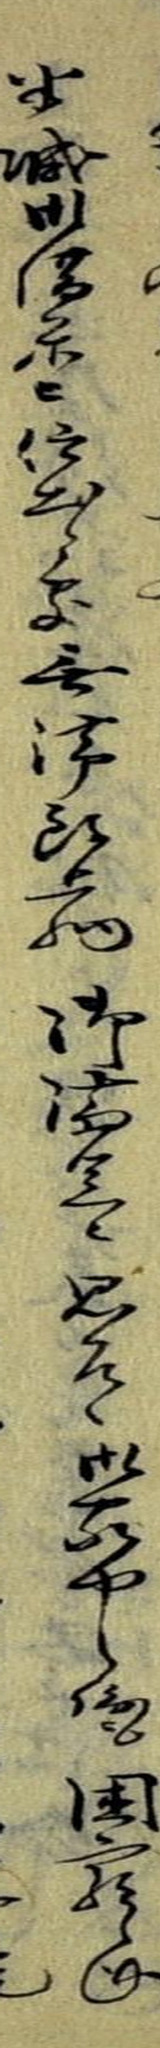半減御借米被仰出候処無滞致上納御満足ニ思召候御家中之儀も困窮之趣
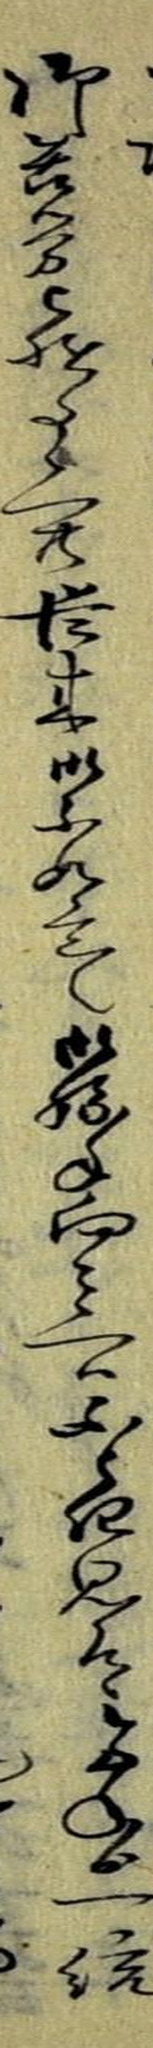御苦労被遊事候へ共従来御不如意之御勝手向ニ候へハ不被任思召之五年ゟ一統
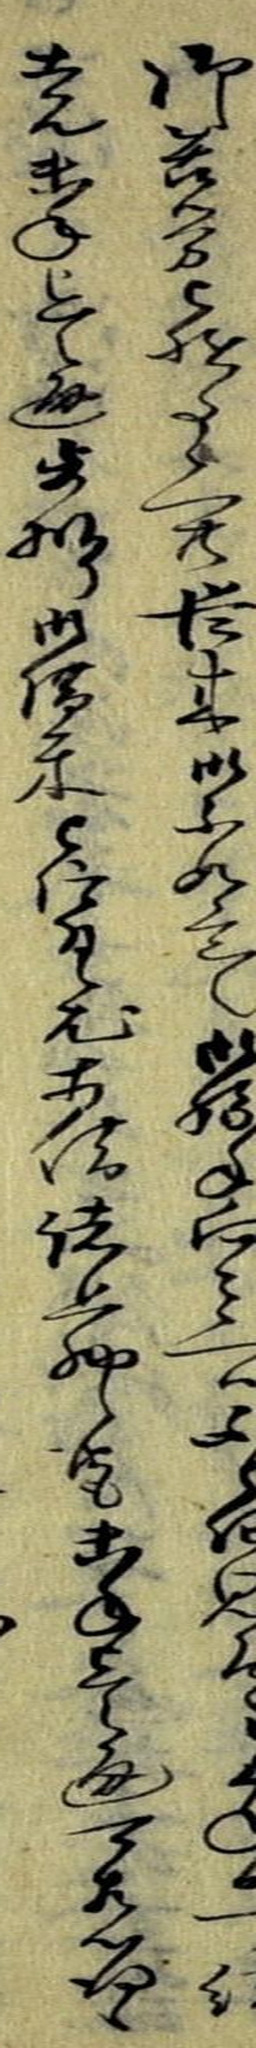去ル未年迄之通歩掛り御借米被仰付候尤拝借諸上納之儀も未年迄之通可相心得候
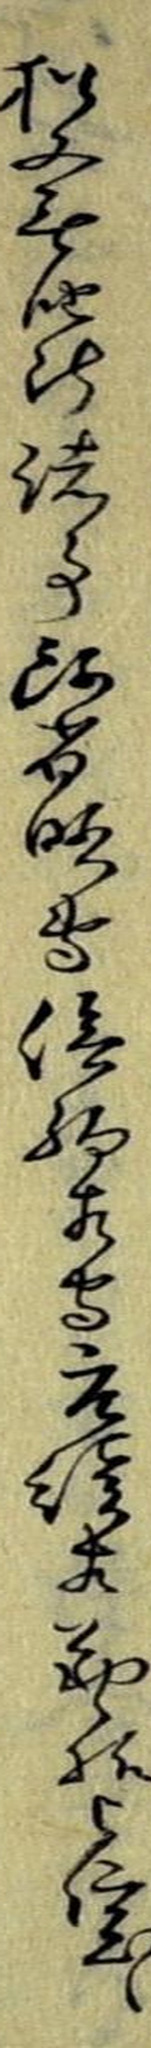猶又無油断諸事致省略専倹約相守取続相勤候様被仰出候
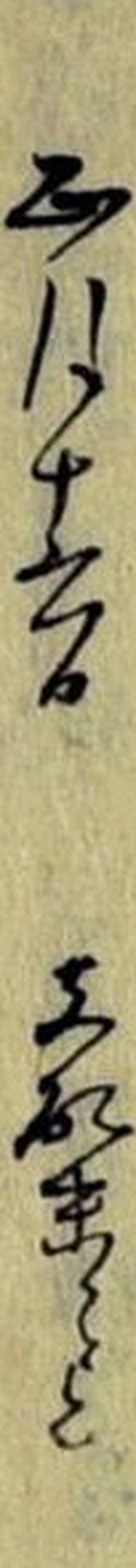正月十六日支配末々迄
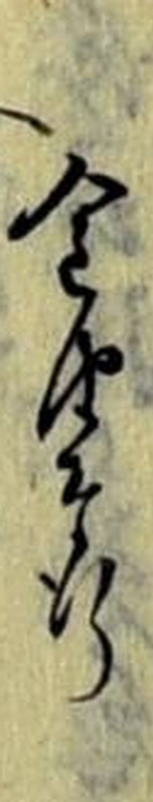金津奉行
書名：命令之部 五
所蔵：福井県文書館 Fukui Prefectural Archives
